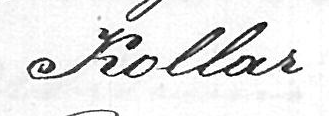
Kollar
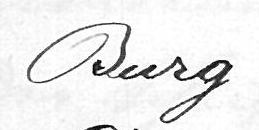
Burg
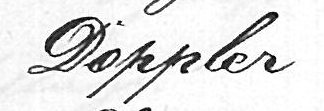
Doppler
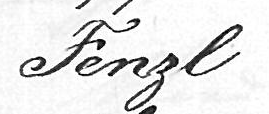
Fenzl
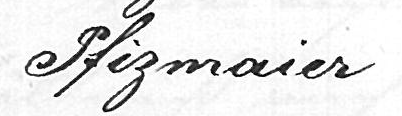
Pfizmaier
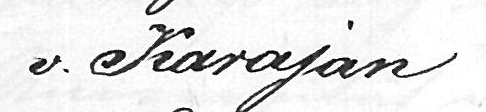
v. Karajan
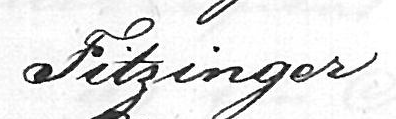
Fitzinger
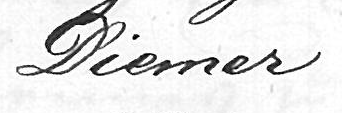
Diemer
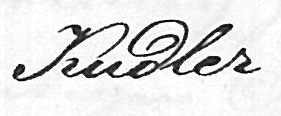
Kudler
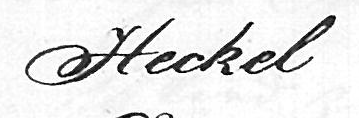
Heckel
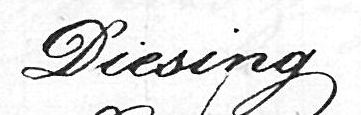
Diesing
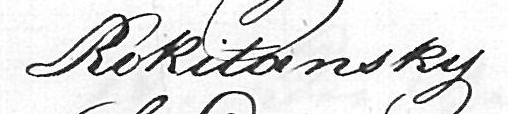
Rokitansky
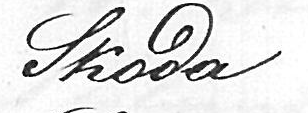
Skoda
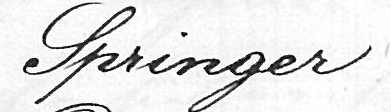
Springer
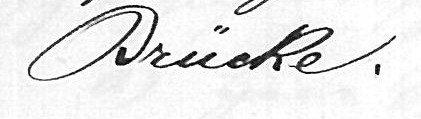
Brücke.
